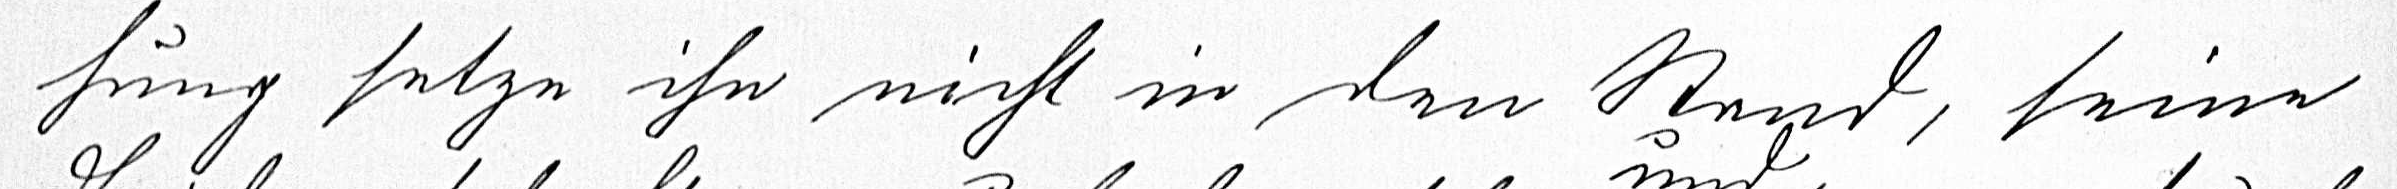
hung setzte ihn nicht in den Stand, seine
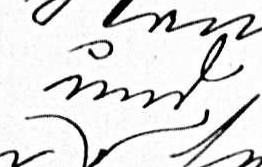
und
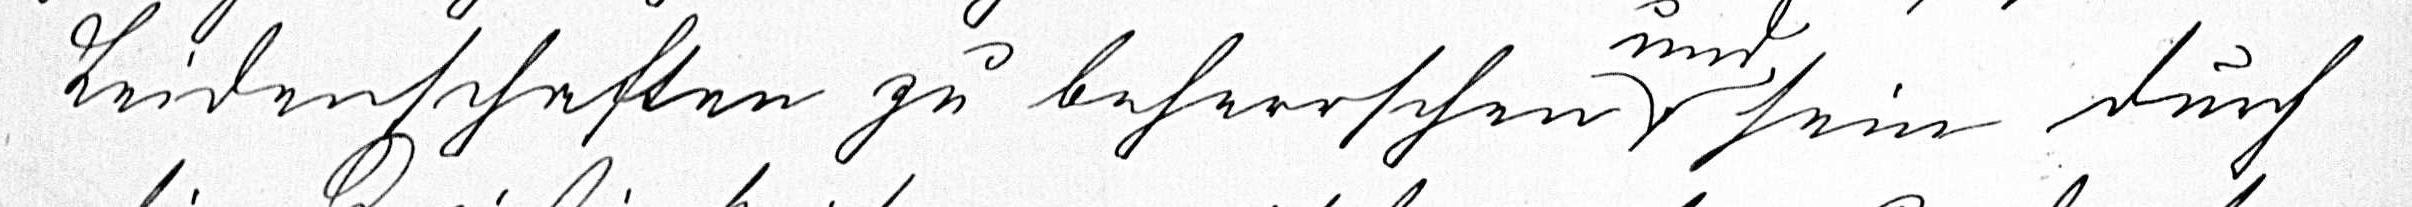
Leidenschaften zu beherrschen sein durch
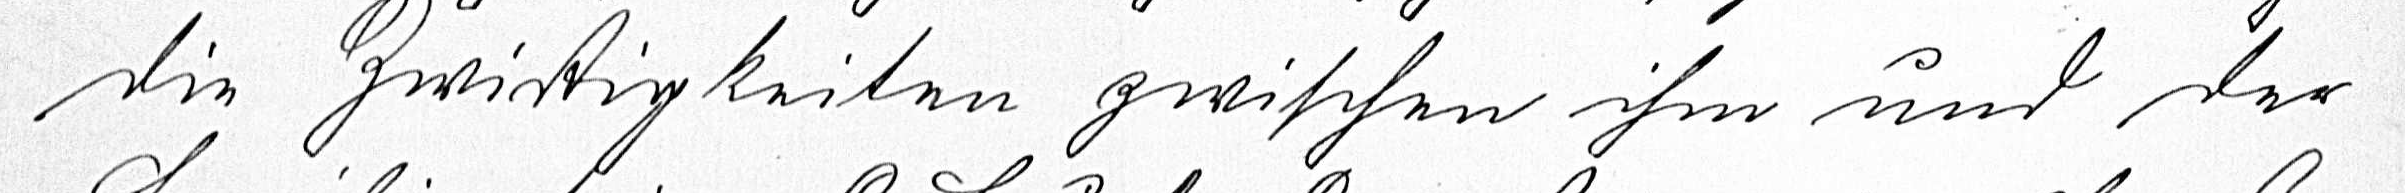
die Zwistigkeiten zwischen ihm und der
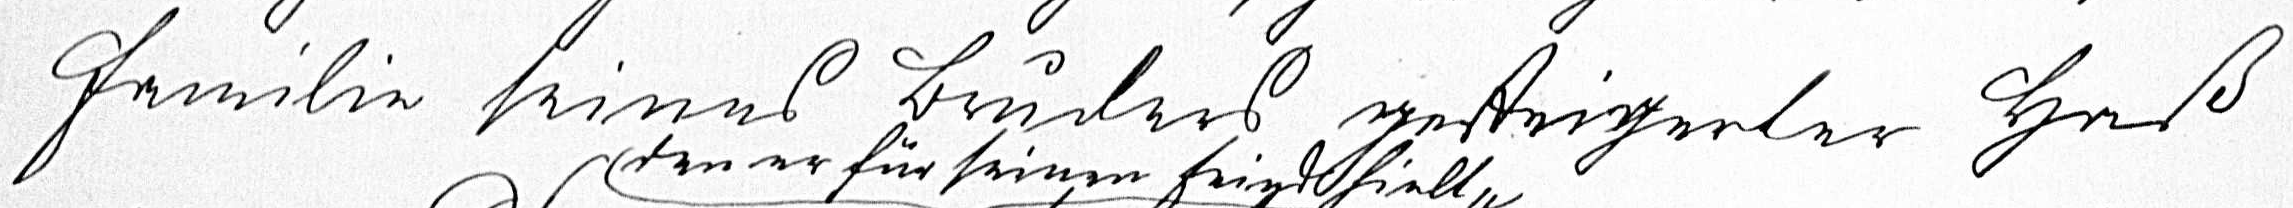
Familie seines Bruders gesteigerter Haß
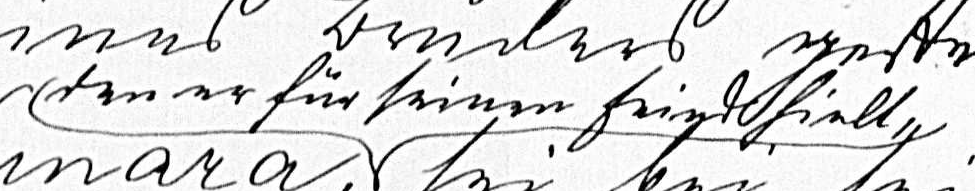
den er für seinen Feind hielt
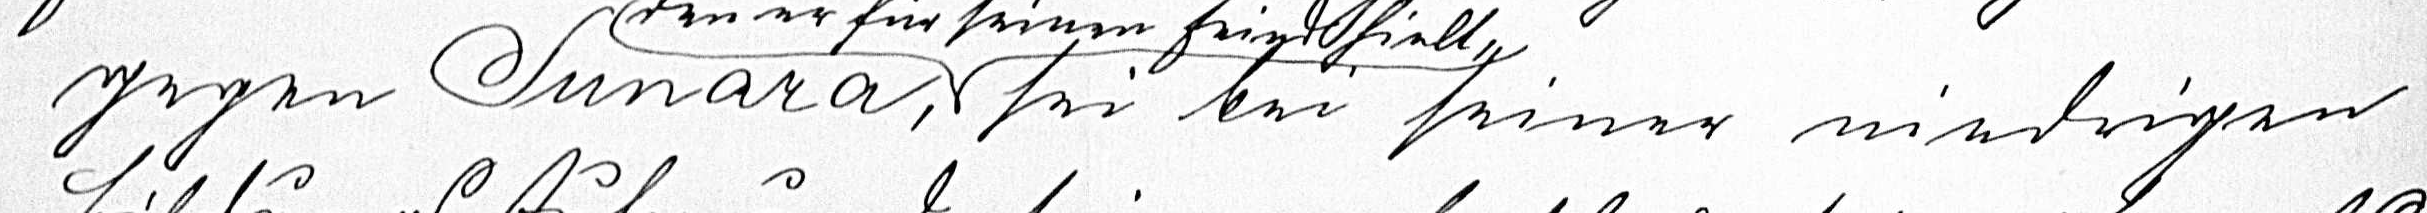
gegen Sunara, sei bei seiner niedrigen
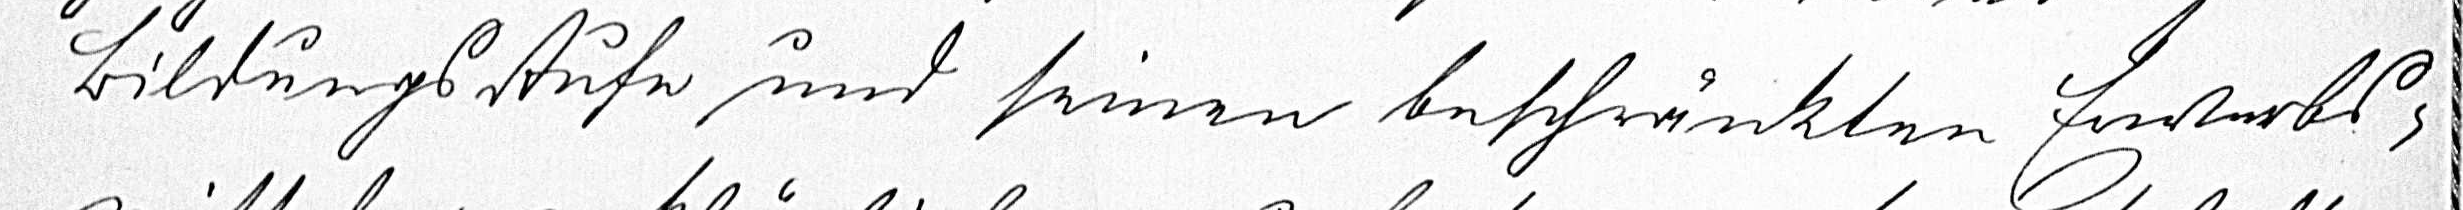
Bildungsstufe und seinen beschränkten Erwerbs¬
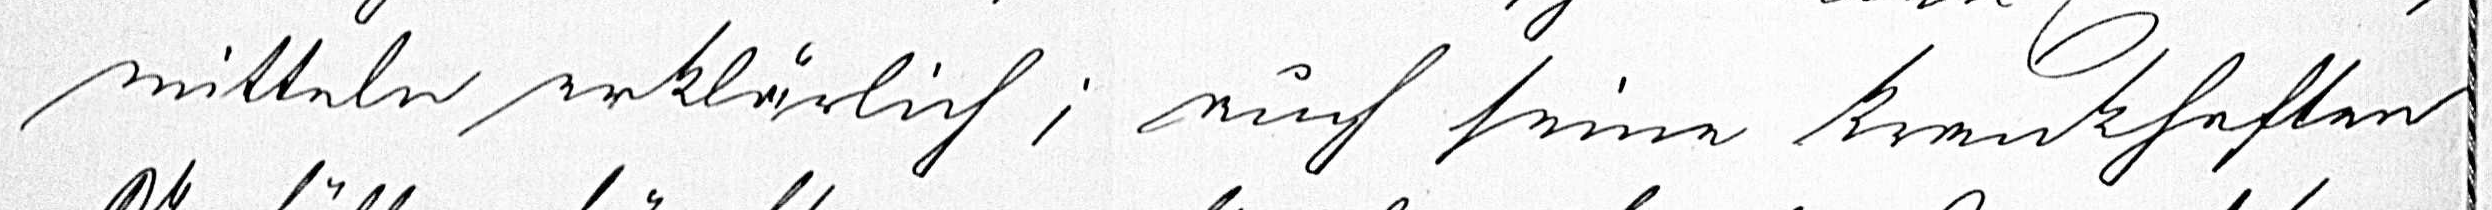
mitteln erklärlich; auch seine krankhaften
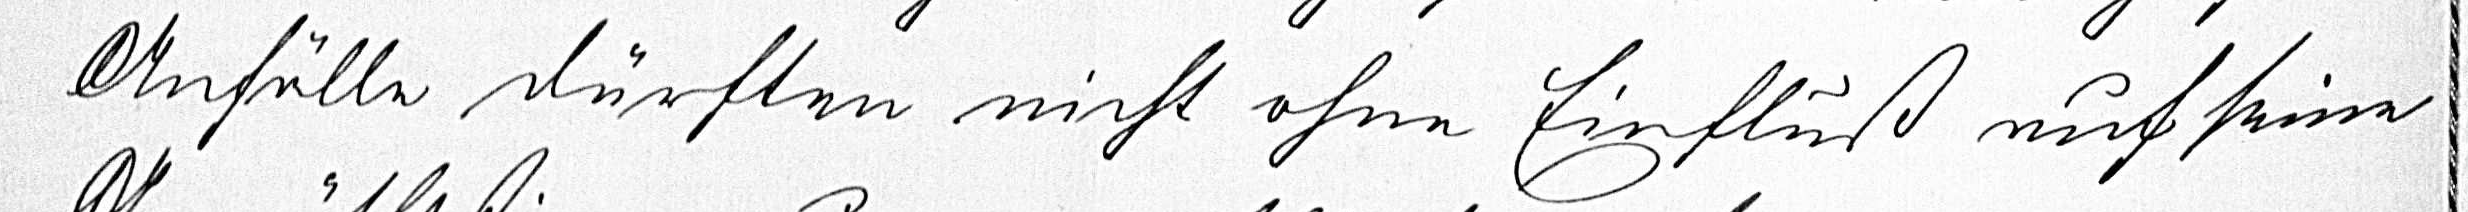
Anfälle dürften nicht ohne Einfluß auf seine
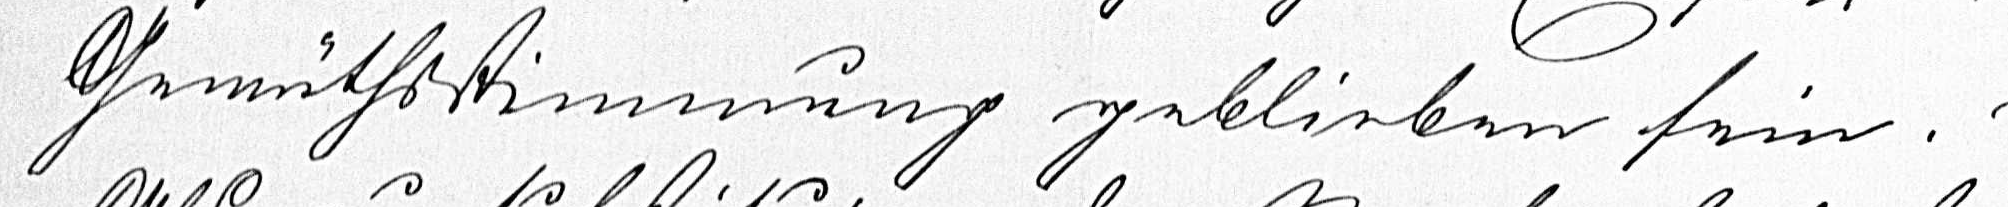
Gemüthsstimmung geblieben sein.
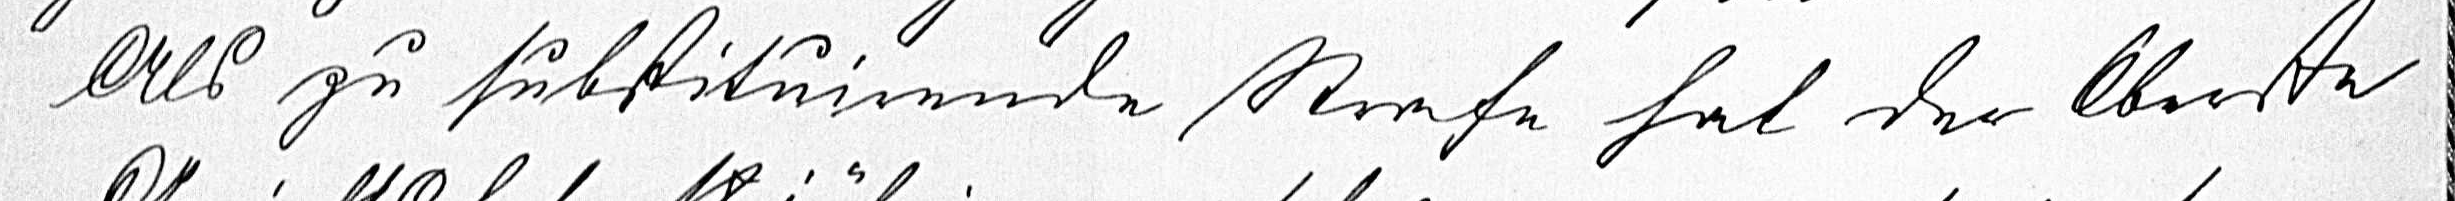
Als zu substituirende Strafe hat der Oberste
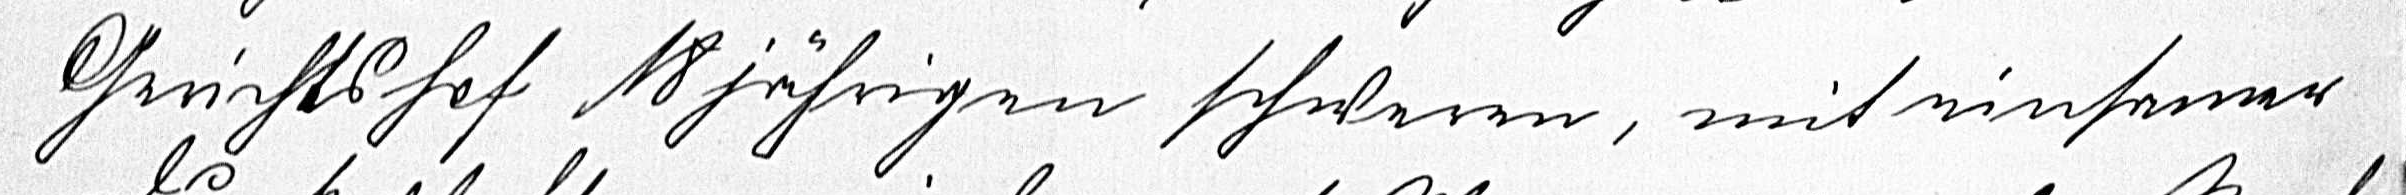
Gerichtshof 18jährigen schweren, mit einsamer
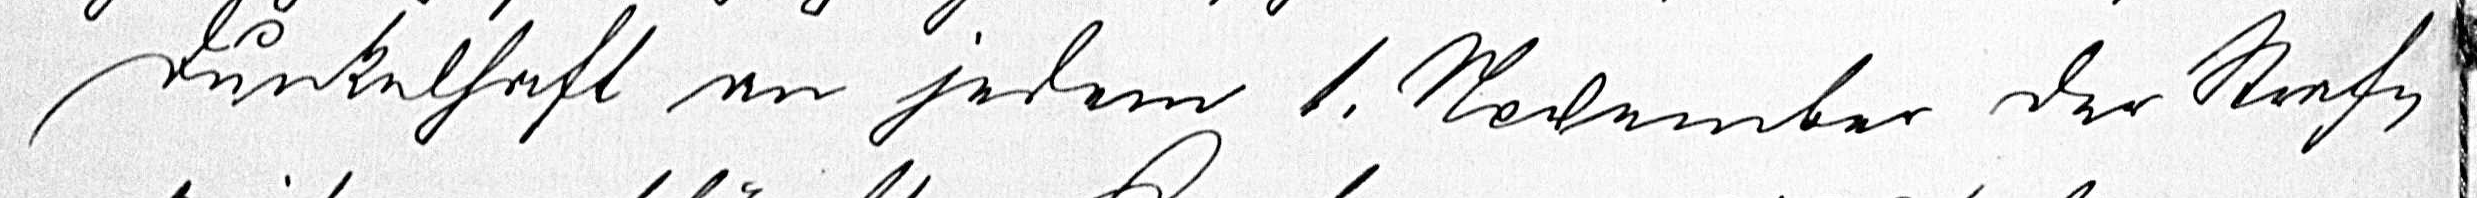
Dunkelhaft an jedem 1. November der Straf¬
